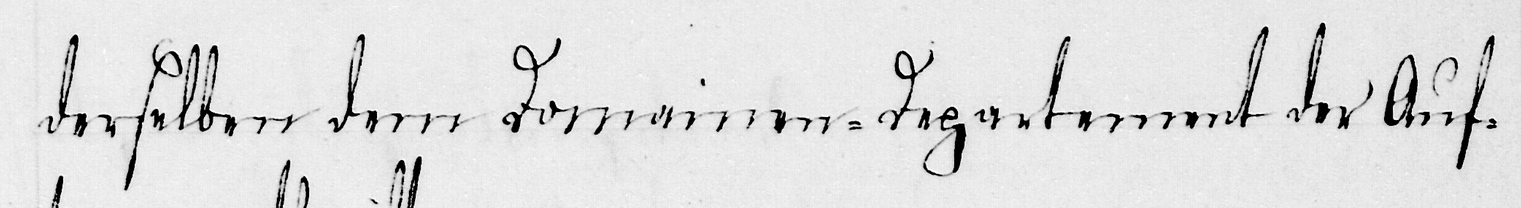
derselben dem Domainen-Departement der Auf¬
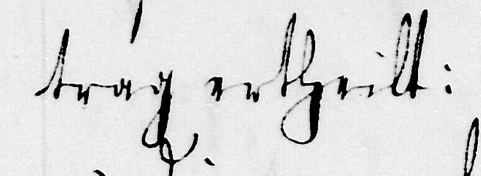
trag ertheilt:
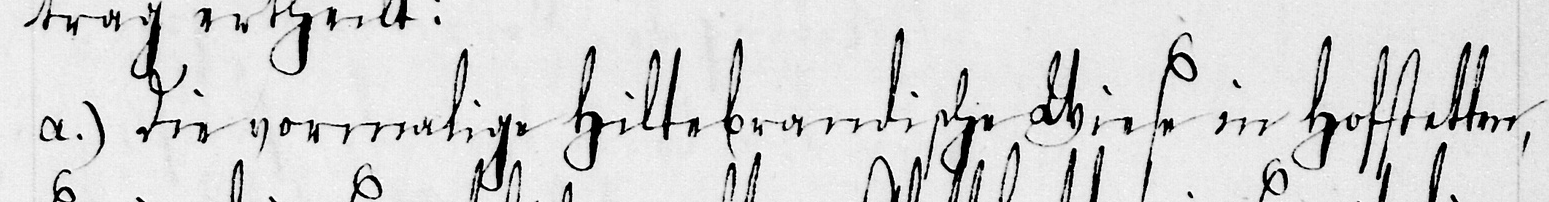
a.) Die vormalige Hiltebrandische Wiese in Hofstette¬
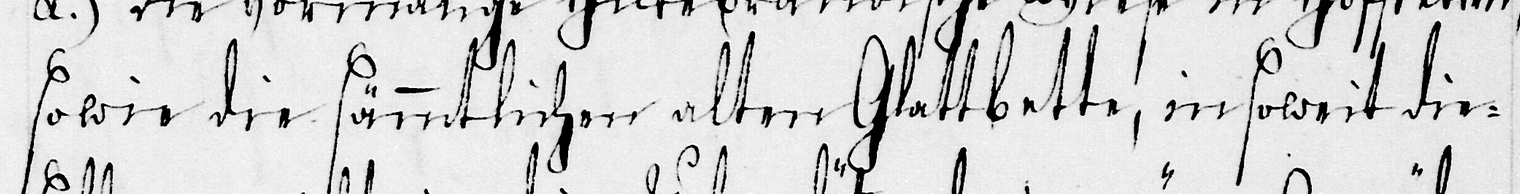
sowie die sämmtlichen alten Glattbette, insoweit die¬
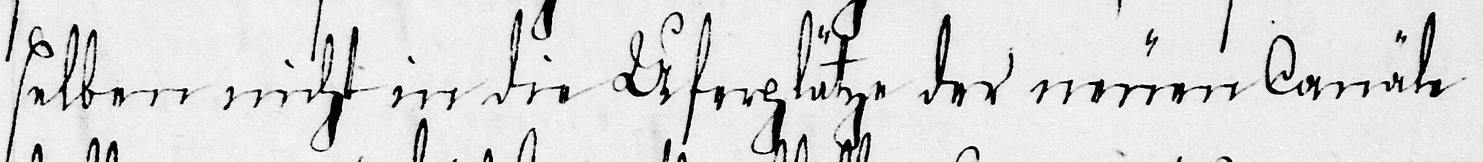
selben nicht in die Uferplätze der neuen Canäle
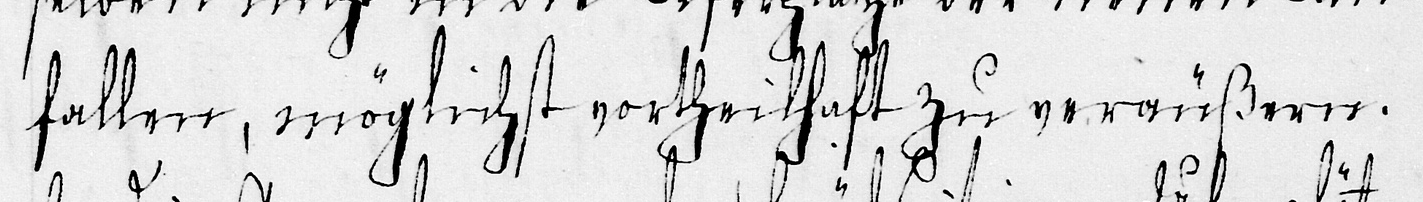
fallen, möglichst vortheilhaft zu veräußern.
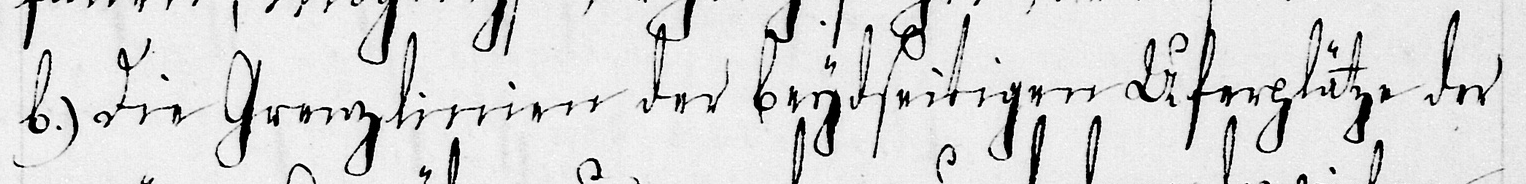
b.) Die Grenzlinien der beydseitigen Uferplätze der
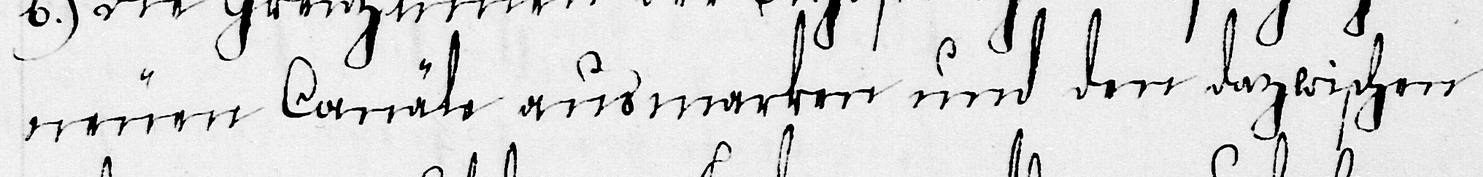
neuen Canäle ausmachen und den dazwischen
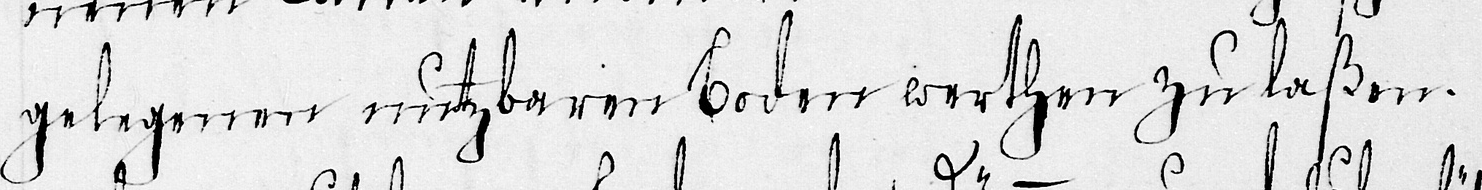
gelegenen nutzbaren Boden werthen zu laßen.
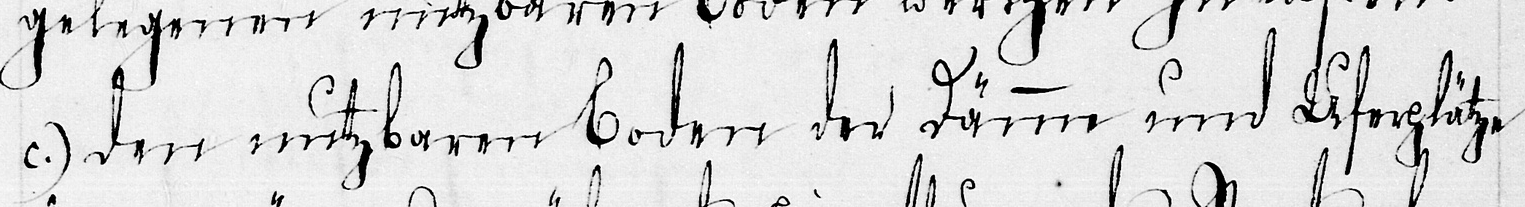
c.) Den nutzbaren Boden der Dämme und Uferplätze
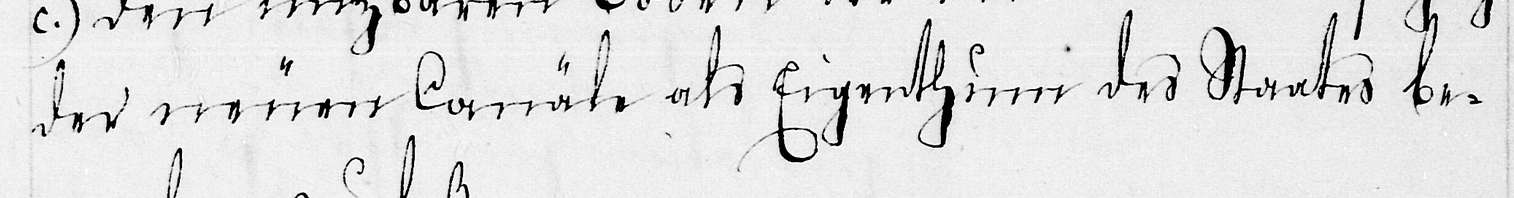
der neuen Canäle als Eigenthum des Staates be¬
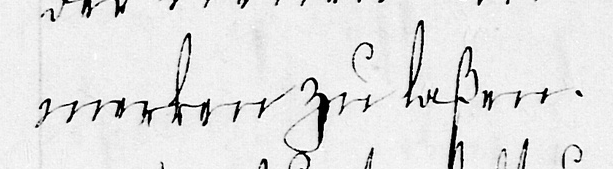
merken zu laßen.
